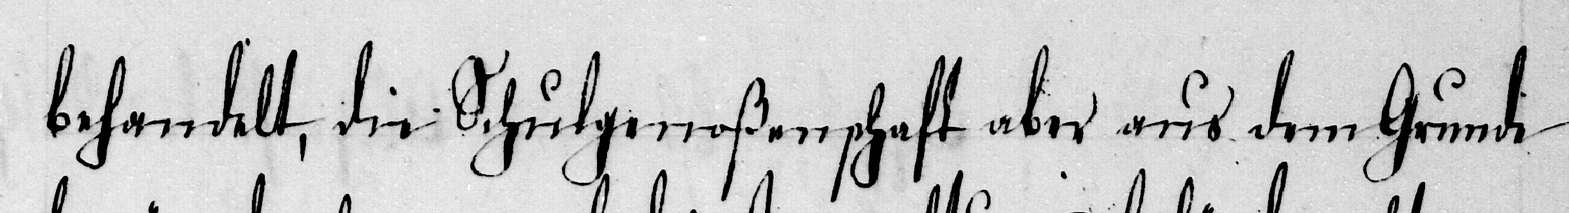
behandelt, die Schulgenoßenschaft aber aus dem Grunde
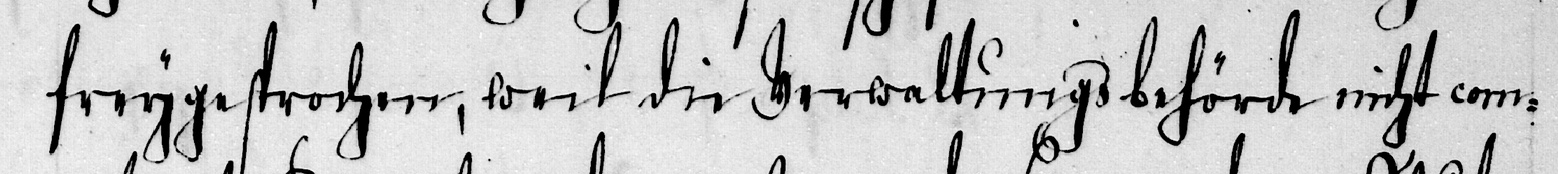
freygesprochen, weil die Verwaltungsbehörde nicht com¬
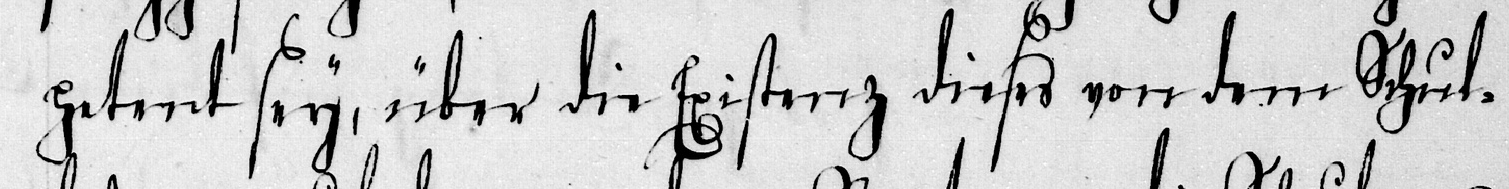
petent sey, über die Existenz dieses von dem Schul¬
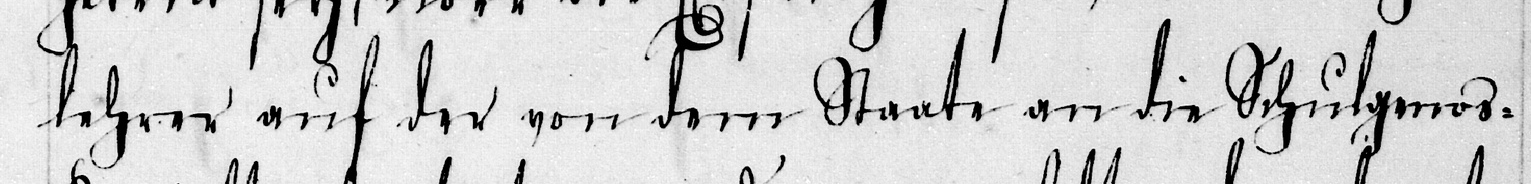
lehrer auf der von dem Staate an die Schulgenoß¬
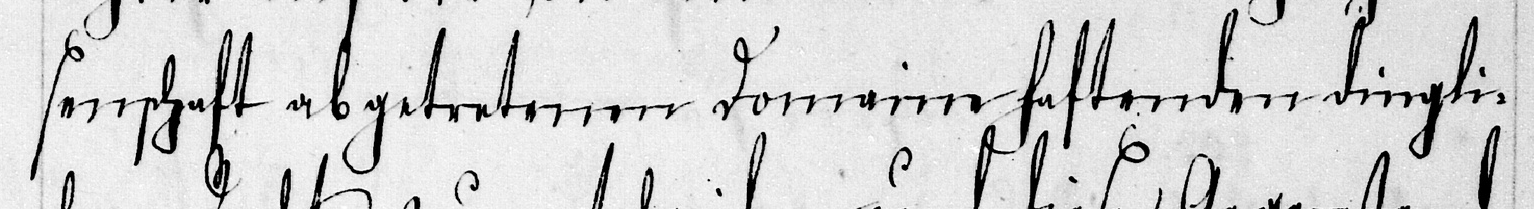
enschaft abgetretenen Domaine haftenden dingli¬
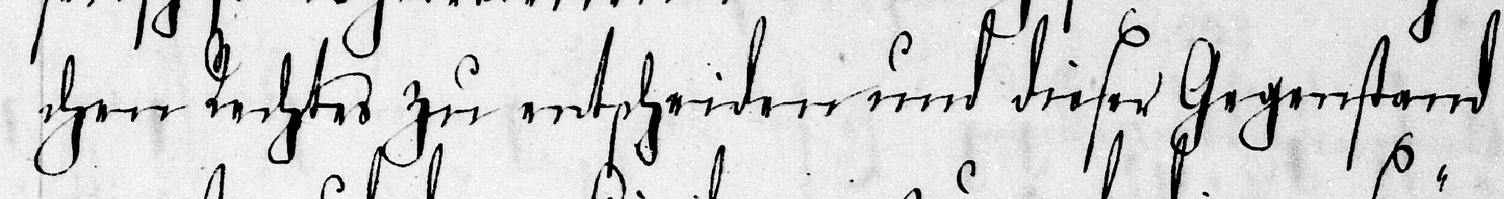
chen Rechtes zu entscheiden und dieser Gegenstand
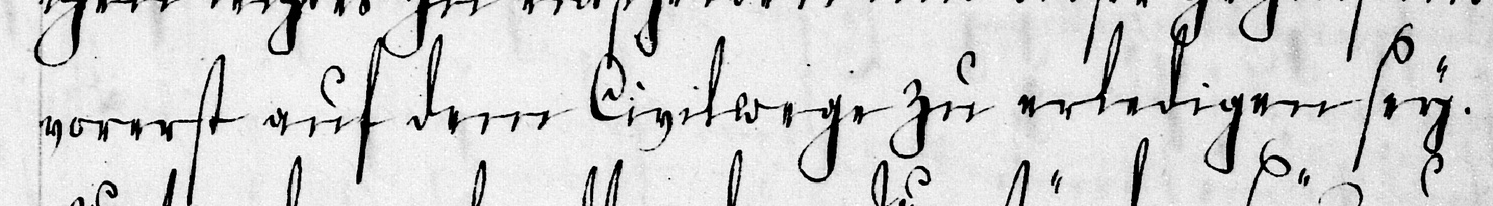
vorerst auf dem Civilwege zu erledigen sey.
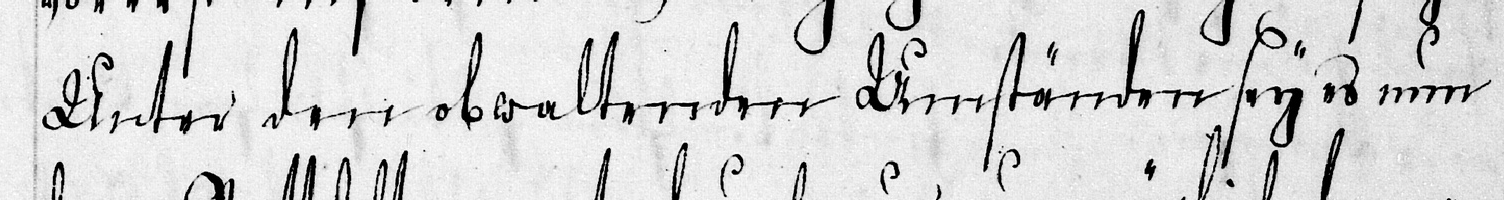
Unter den obwaltenden Umständen sey es nun
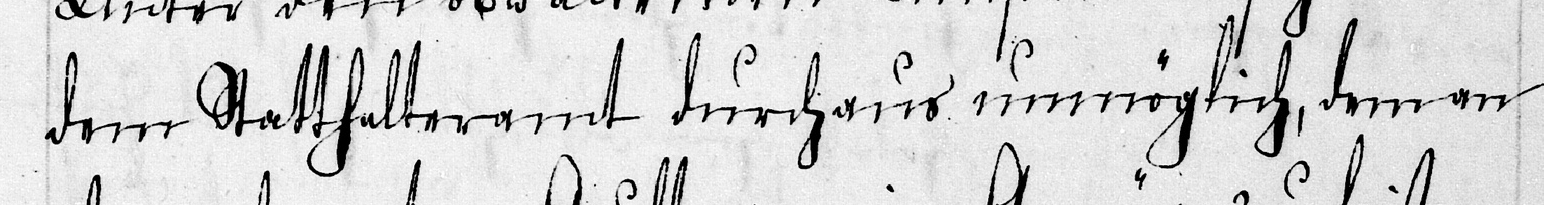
dem Statthalteramt durchaus unmöglich, dem an
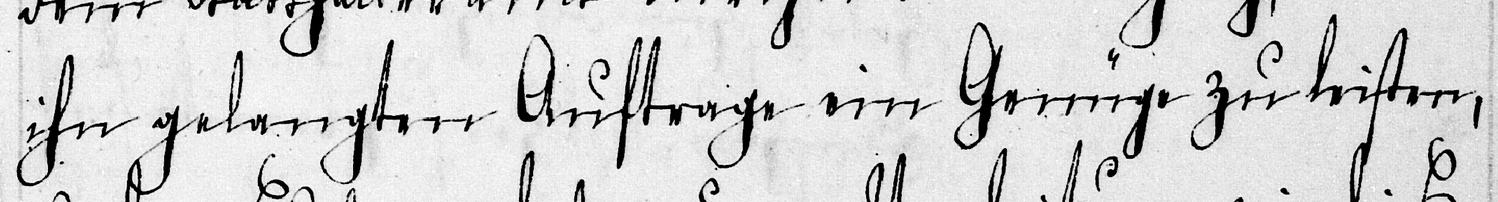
ihn gelangten Auftrage ein Genüge zu leisten,
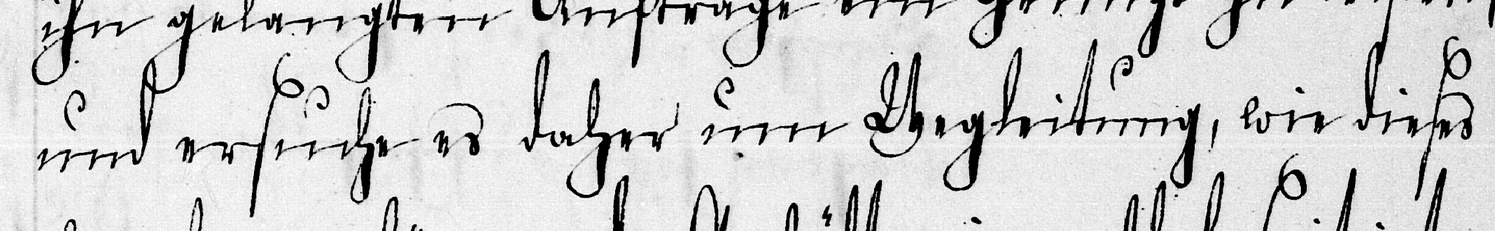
und ersuche es daher um Wegleitung, wie dieses
